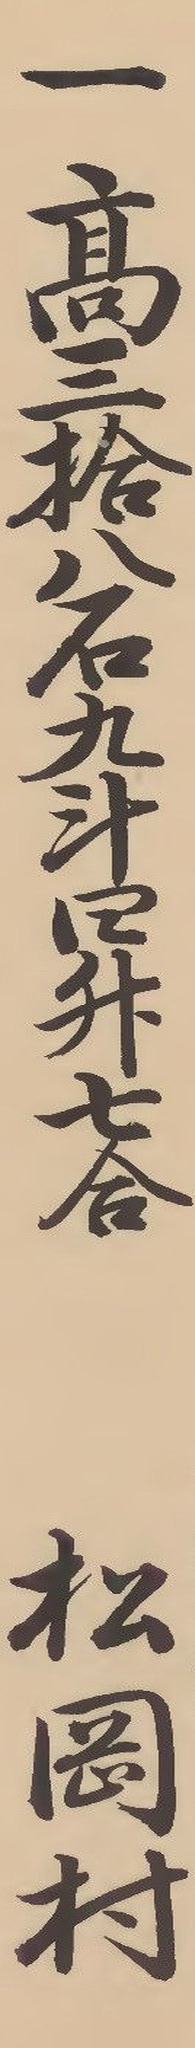一高三拾八石九斗四升七合松岡村
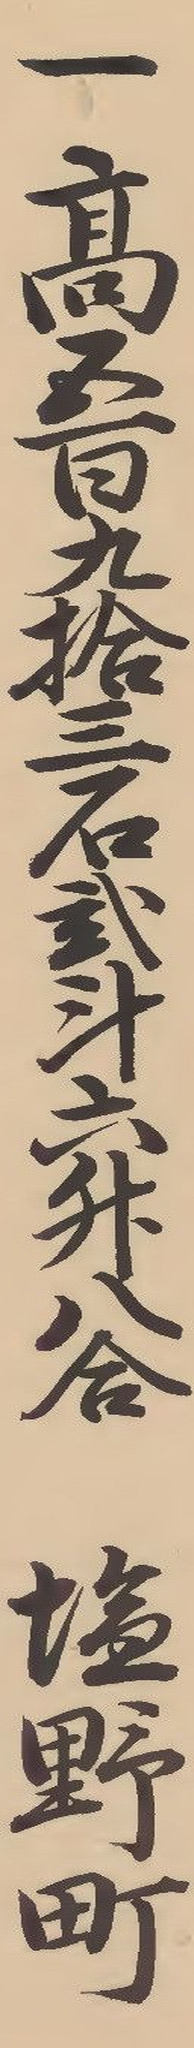一高五百九拾三石弐斗六升八合塩野町
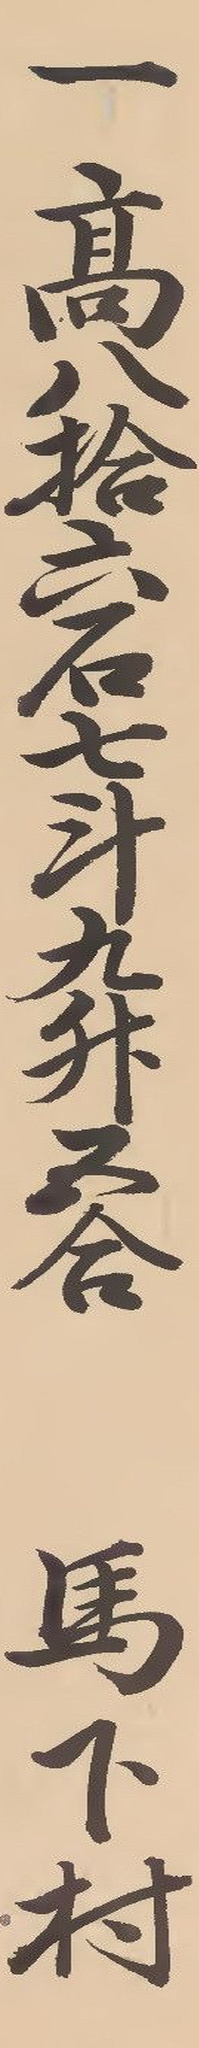一高八拾六石七斗九升五合馬下村
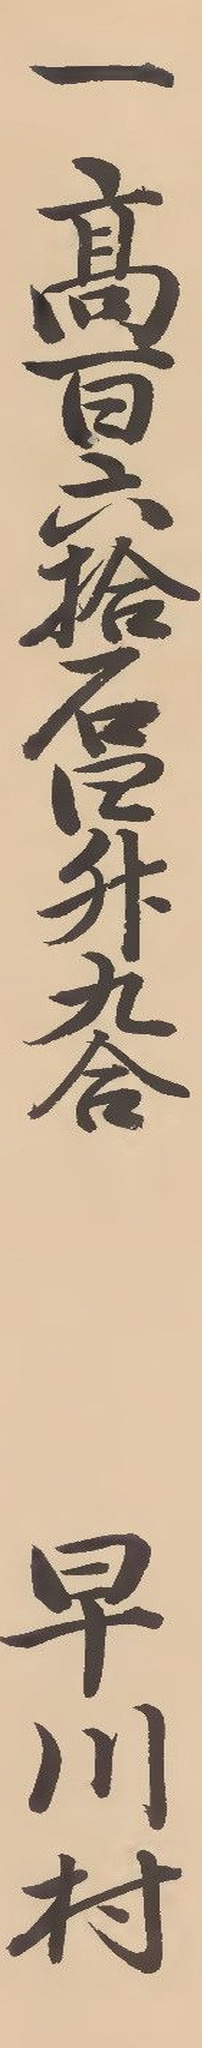一高百六拾石四升九合早川村
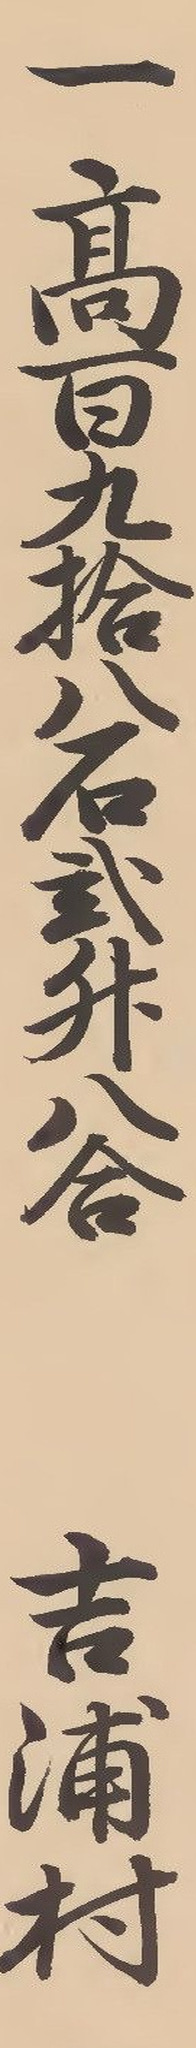一高百九拾八石弐升八合吉浦村
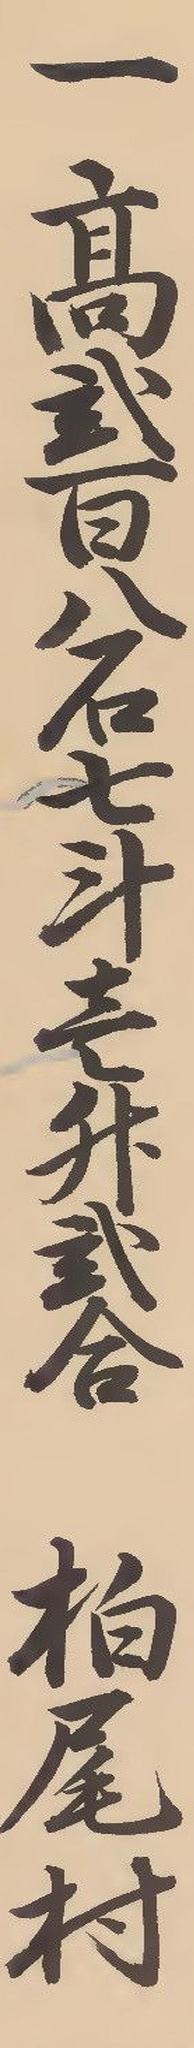一高弐百八石七斗壱升弐合柏尾村

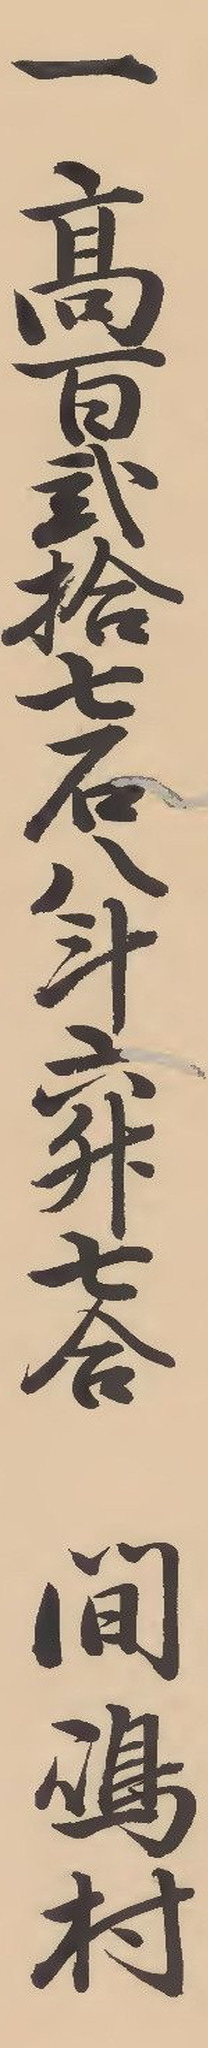一高百弐拾七石八斗六升七合間島村
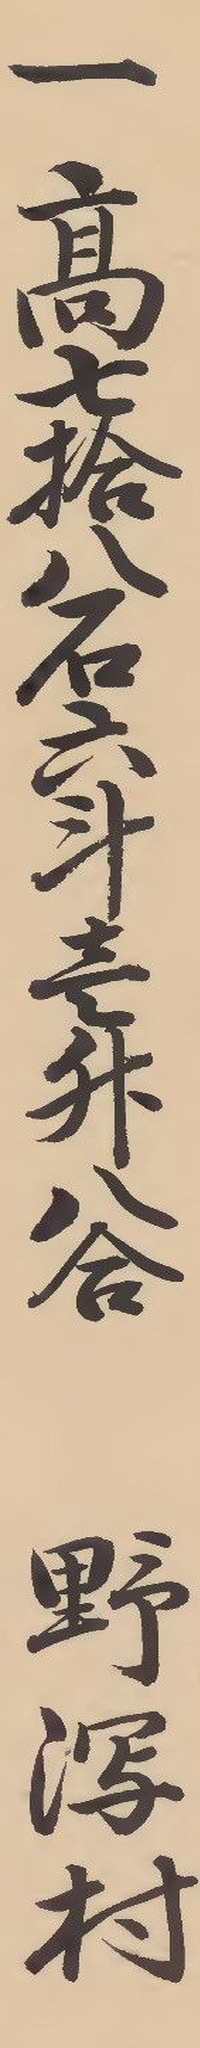一高七拾八石六斗壱升八合野潟村
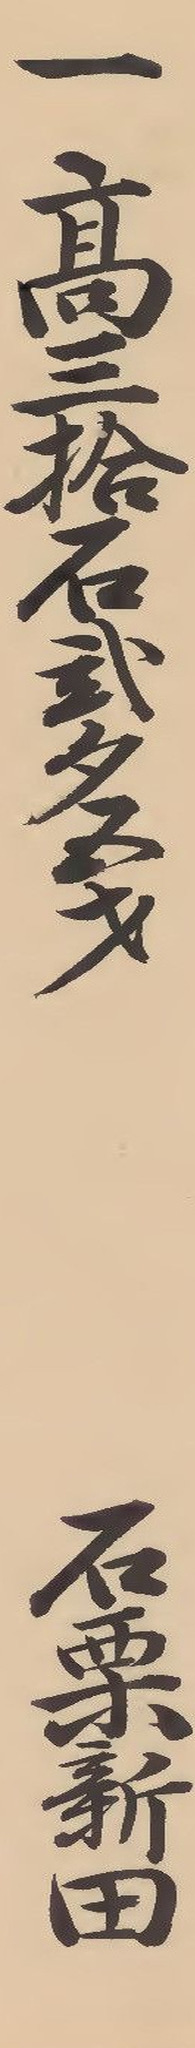一高三拾石弐勺五才石栗新田
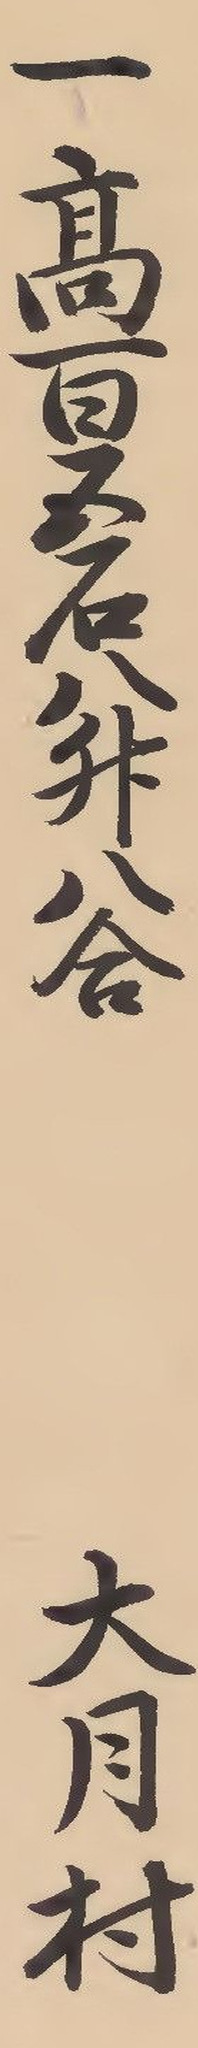一高百五石八升八合大月村
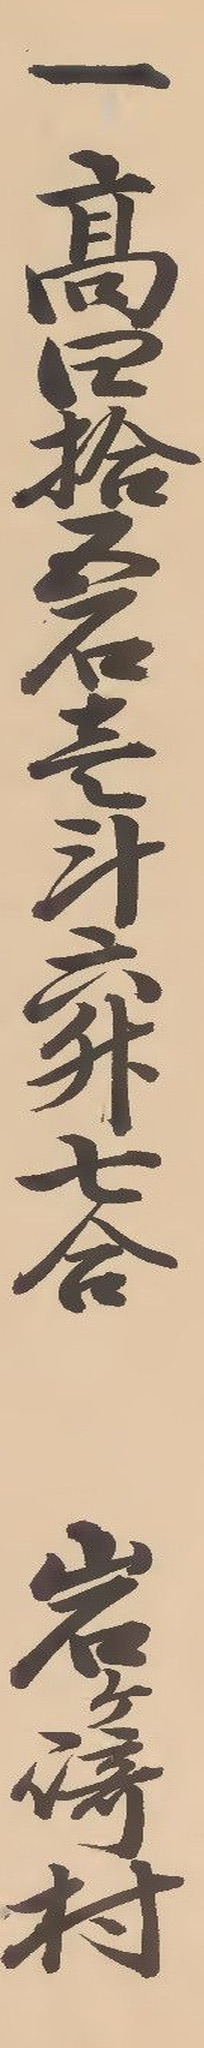一高四拾五石壱斗六升七合岩ヶ崎村
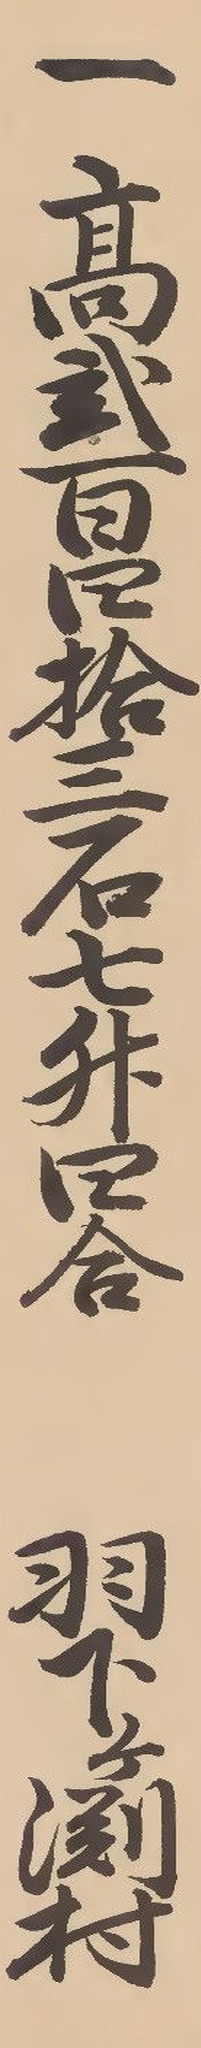一高弐百四拾三石七升四合羽下ヶ淵村
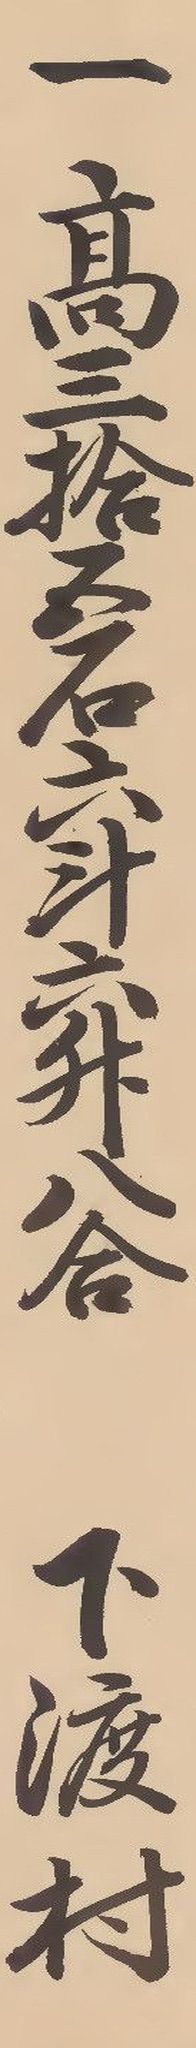一高三拾五石六斗六升八合下渡村
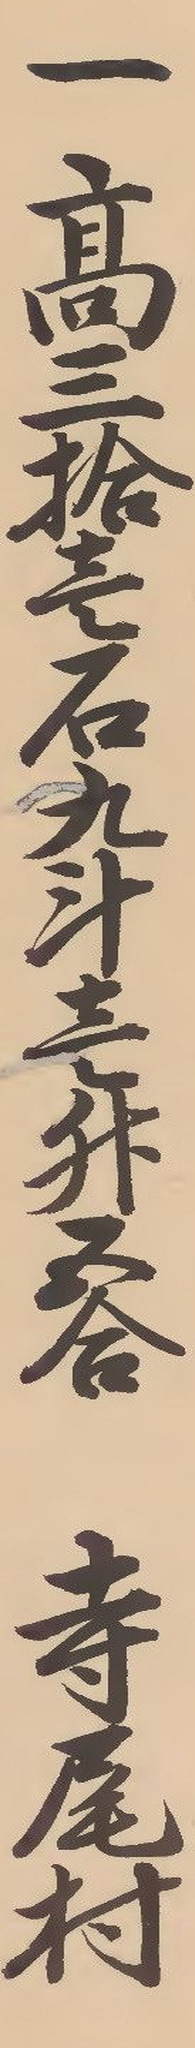一高三拾壱石九斗壱升五合寺尾村

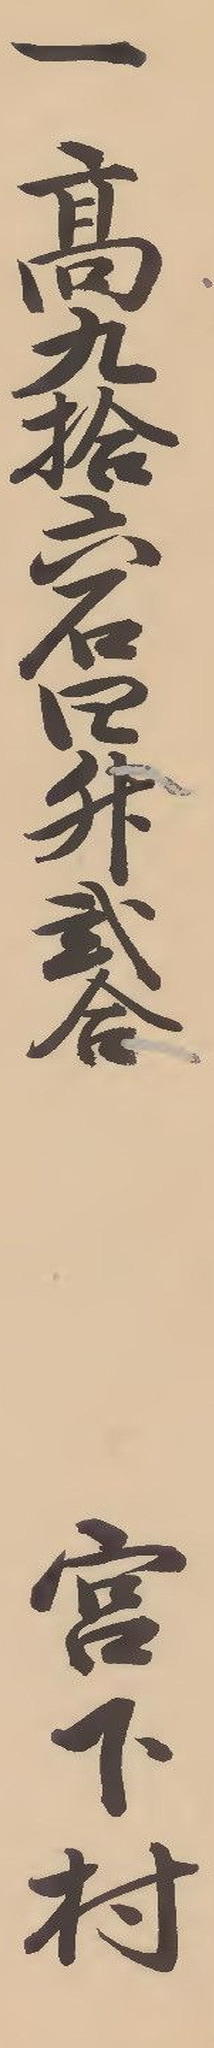一高九拾六石四升弐合宮下村
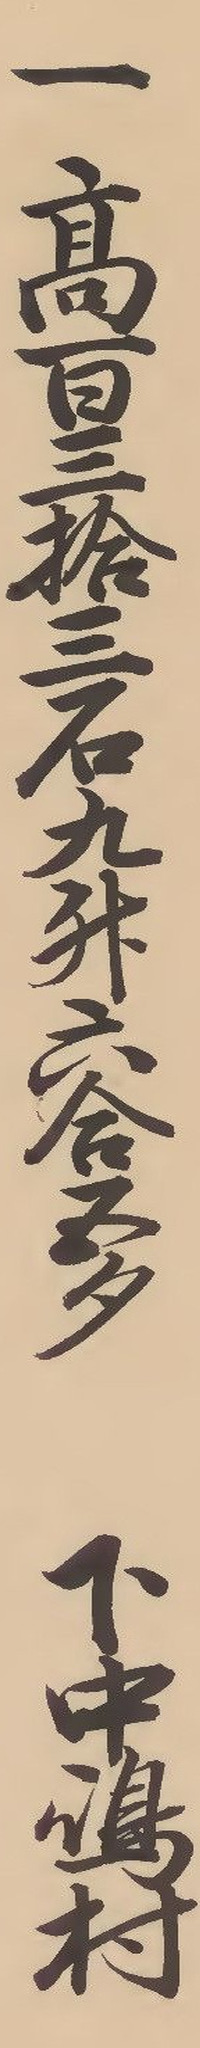一高百三拾三石九升六合五勺下中島村
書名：越後国郷帳　下
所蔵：国立公文書館 National Archives of Japan
